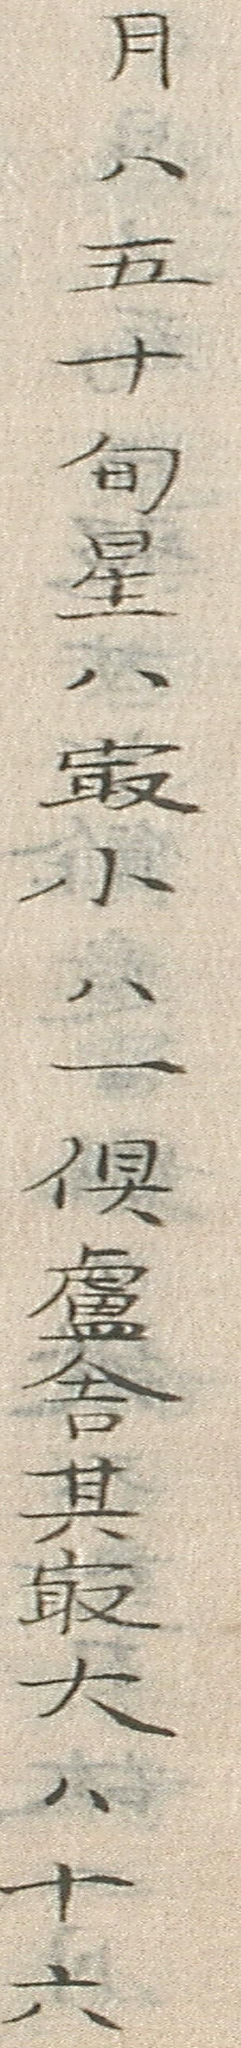月ハ五十旬星ハ最小ハ一俱盧舎其最大ハ十六
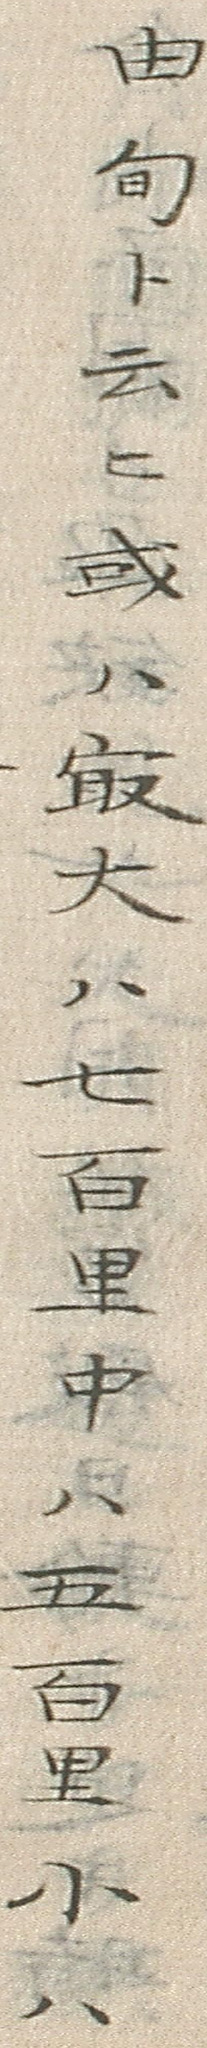由旬ト云ヒ或ハ最大ハ七百里中ハ五百里小ハ
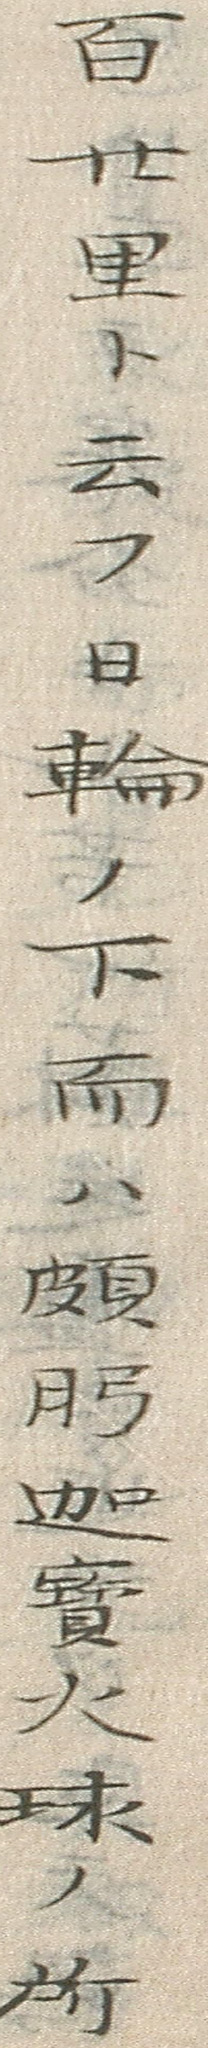百廿里ト云フ日輪ノ下而ハ頗胝迦宝火球ノ所
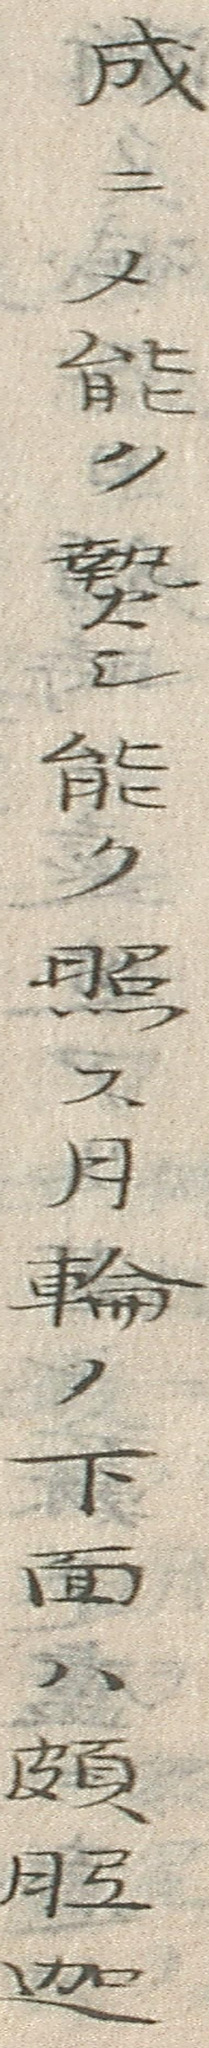成ニシテ能ク熱シ能ク照ス月輪ノ下面ハ頗胝迦
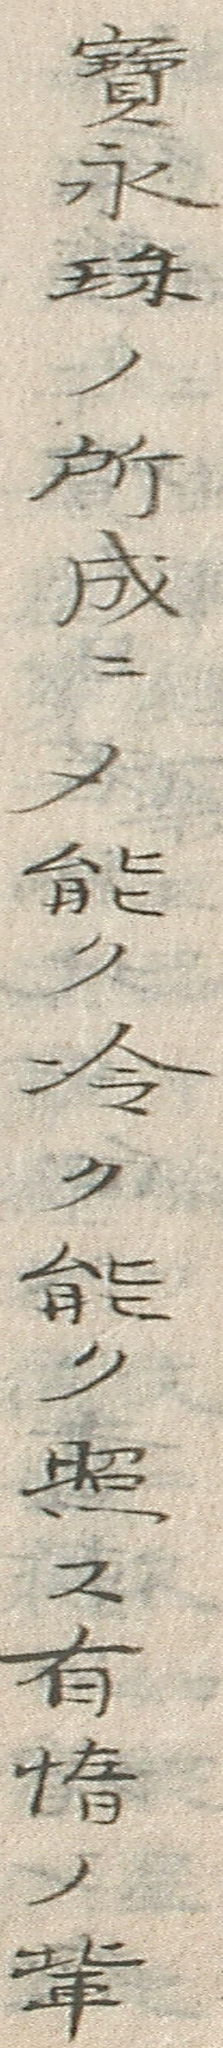宝永珠ノ所成ニシテ能ク冷タ能ク照ス有惰ノ軰
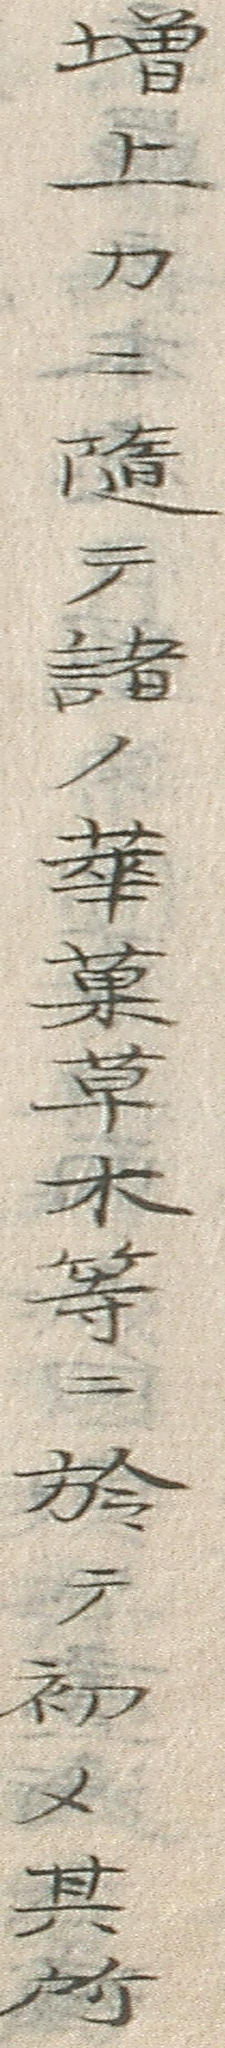増上力ニ随テ諸ノ華果草木等ニ於テ初メ其所
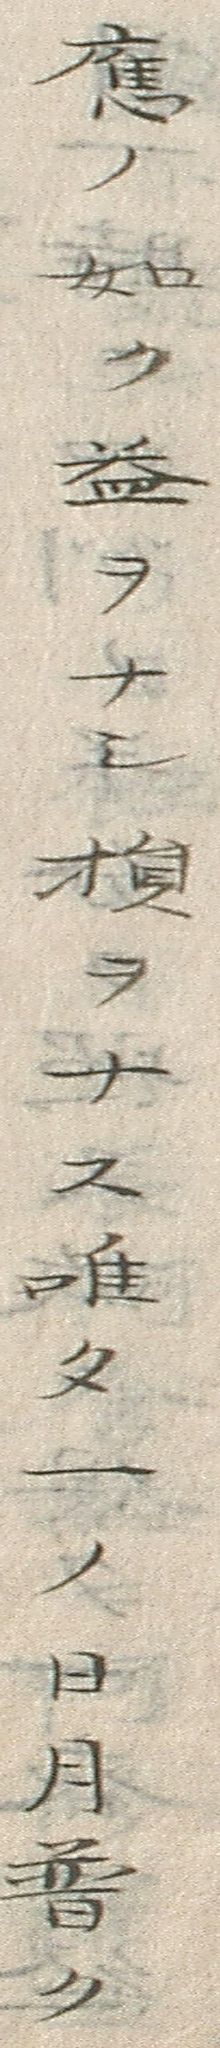応ノ如ク益ヲナシ損ヲナス唯タ一ノ日月普ク
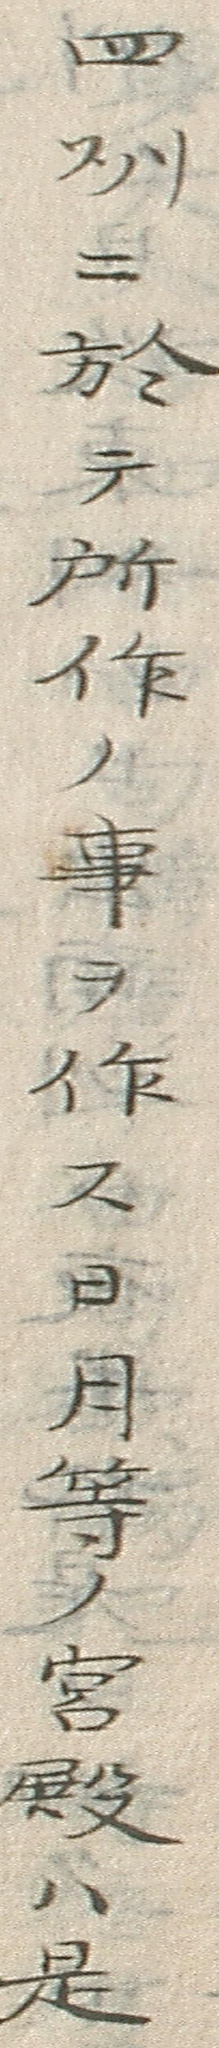四州ニ於テ所作ノ事ヲ作ス日月等ノ宮殿ハ是
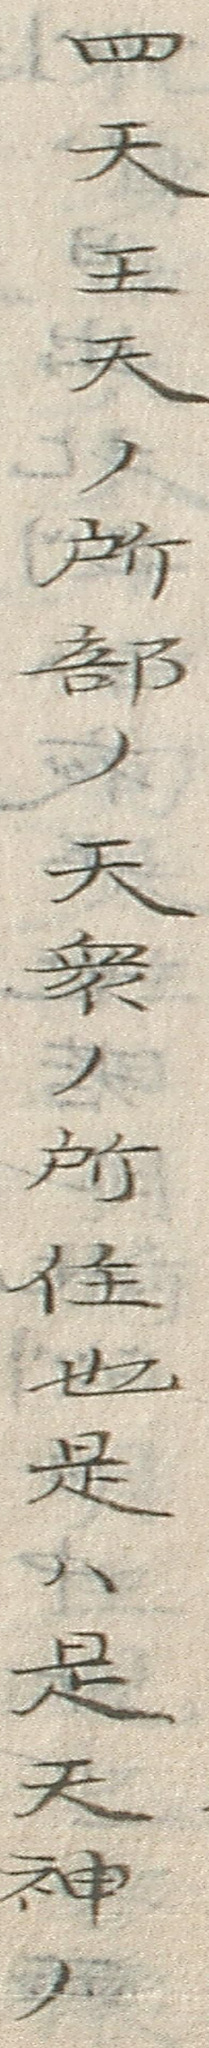四天王天ノ所部ノ天衆ノ所住也是ハ是天神ノ
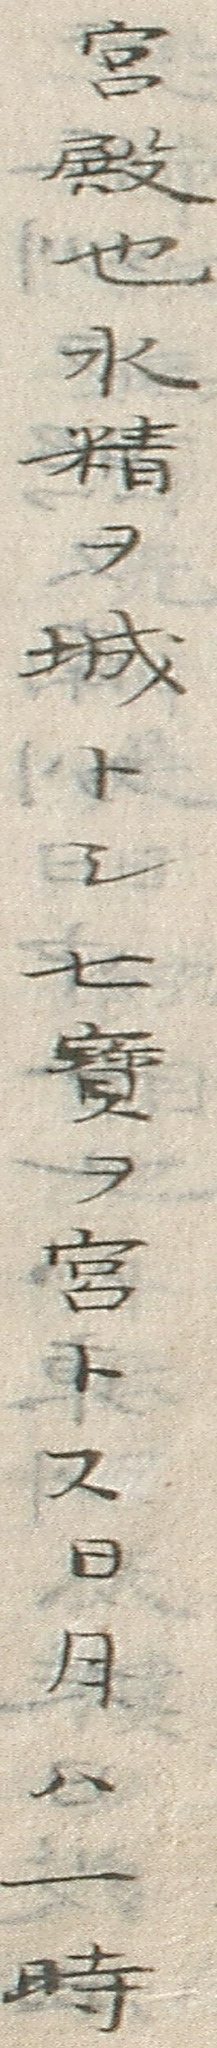宮殿也水精ヲ城トシ七宝ヲ宮トス日月ハ一時

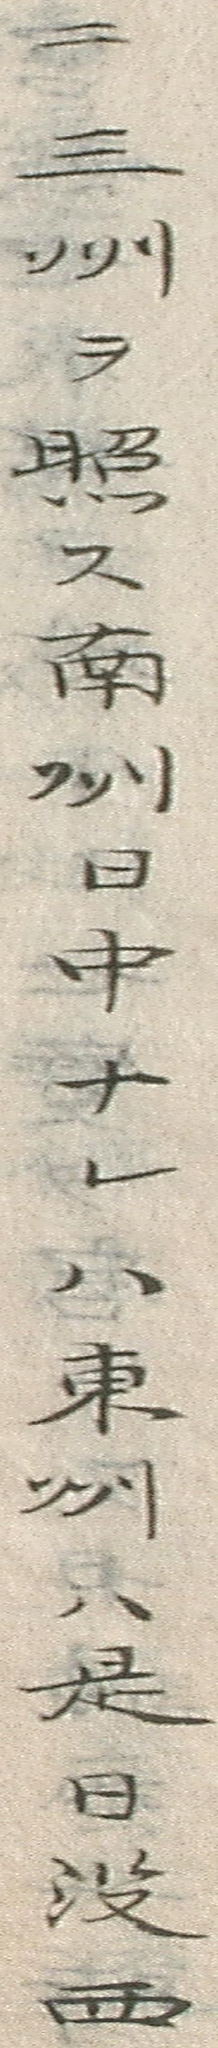ニ三州ヲ照ス南州日中ナレハ東州ハ是日没西
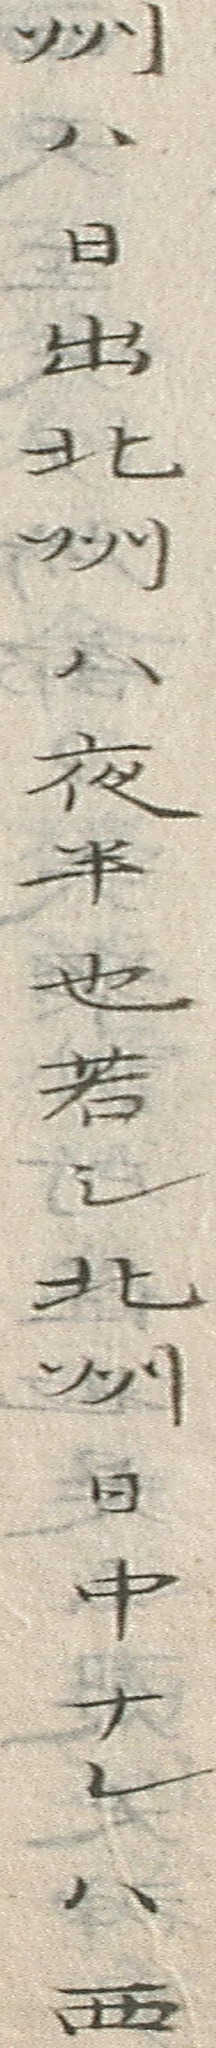州ハ日出北州ハ夜半也若シ北州日中ナレハ西
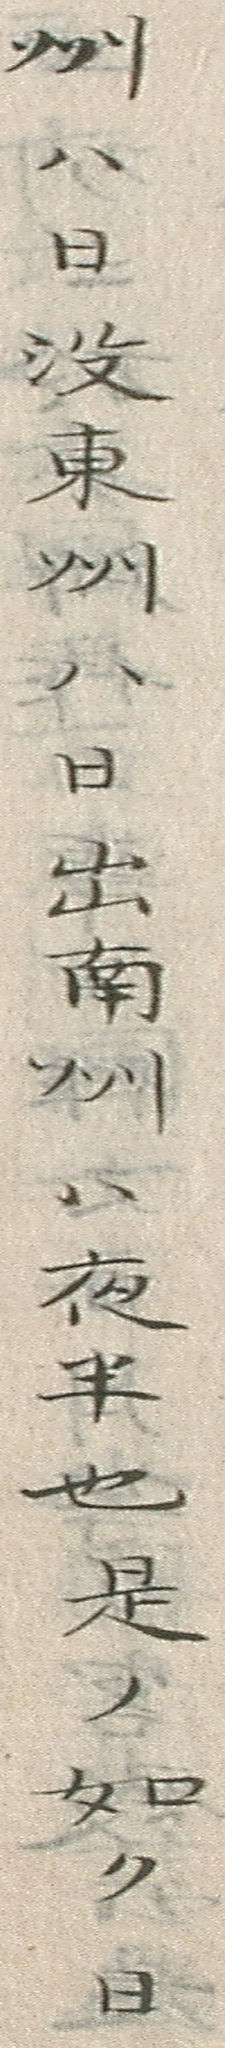州ハ日没東州ハ日出南州ハ夜半也是ノ如ク日
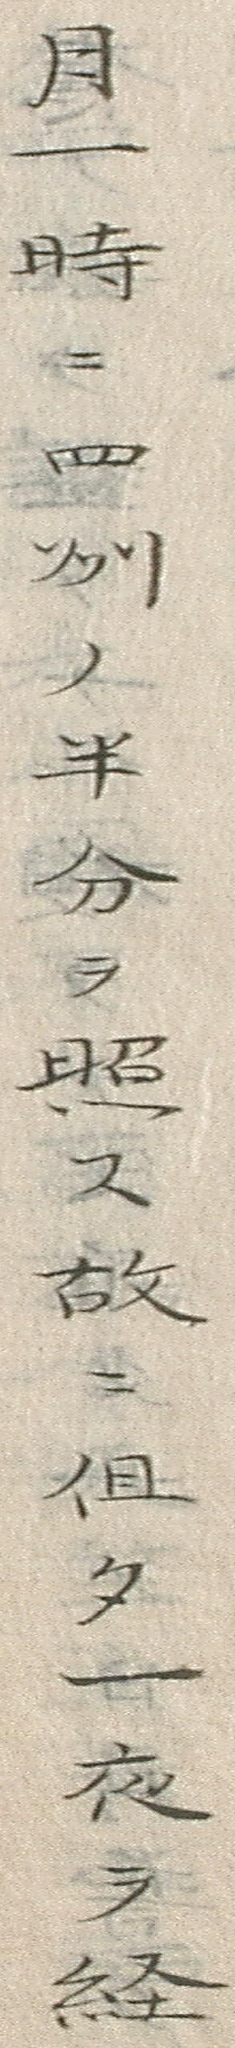月一時ニ四州ノ半分ヲ照ス故ニ但タ一夜ヲ経
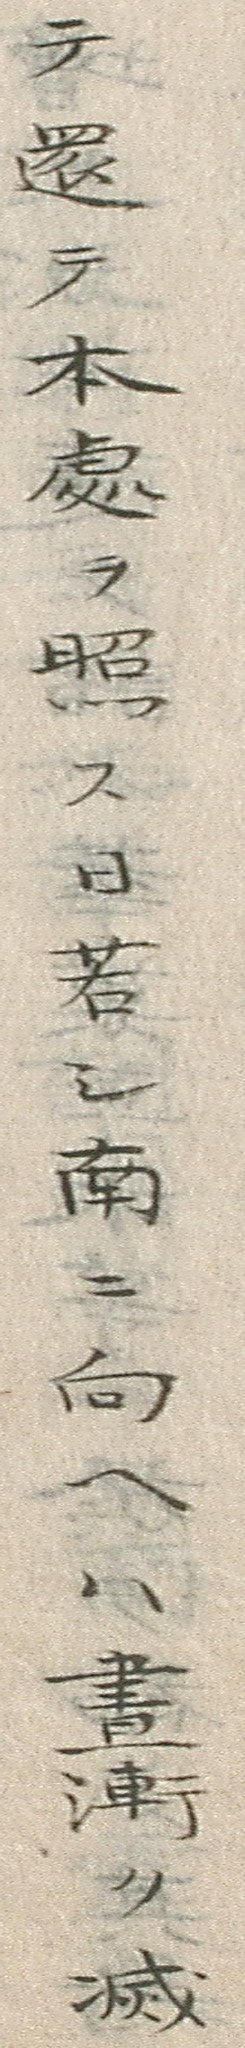テ還テ本処ヲ照ス日若南ニ向ヘハ昼漸ク滅
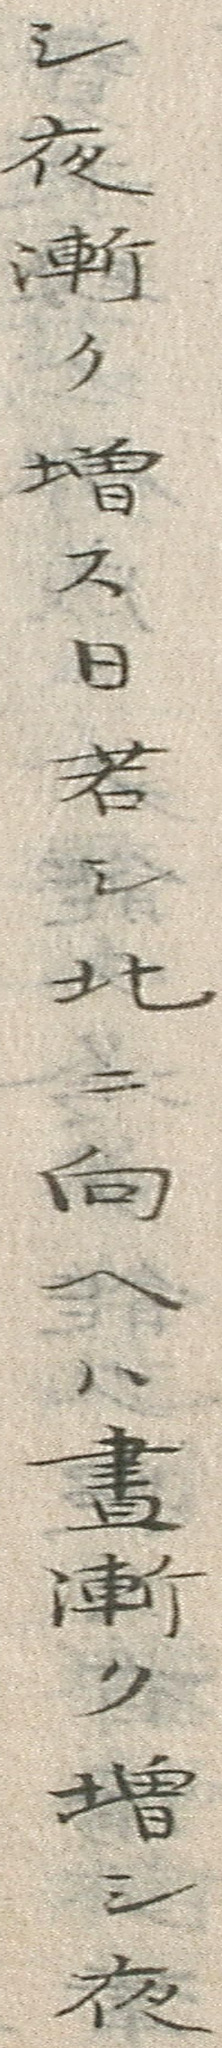シ夜漸ク増ス日若シ北ニ向ヘハ昼漸ク増シ夜
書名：天學略名目羽翼　全
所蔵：東京大学地震研究所図書室 Earthquake Research Institute Library, The University of Tokyo, JAPAN
